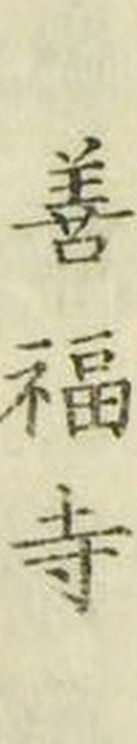善福寺
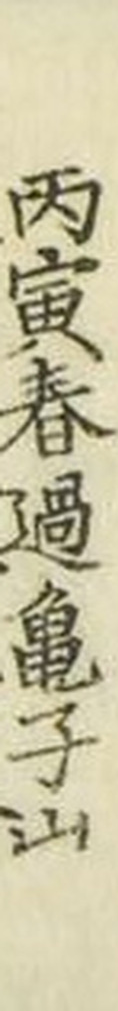丙寅春過亀子山
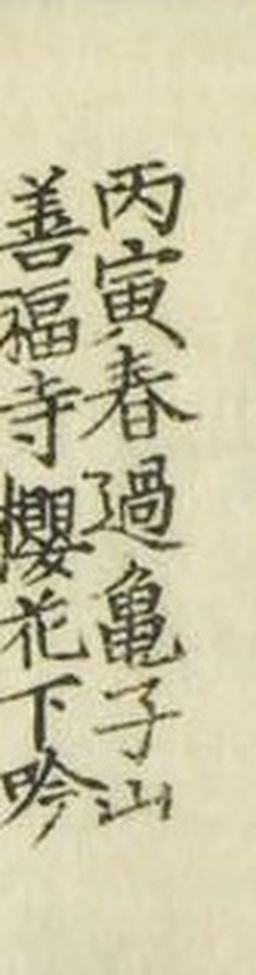善福寺櫻花下吟
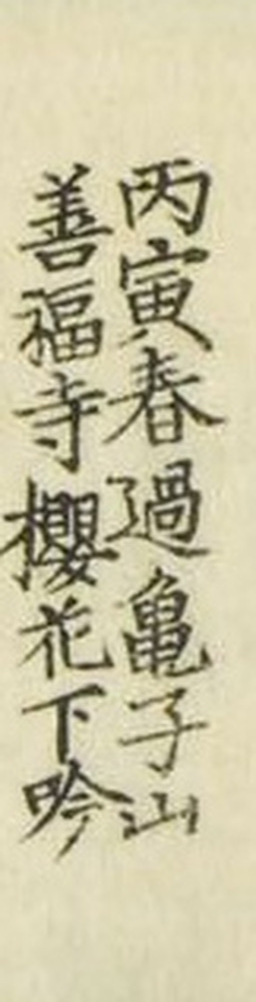善福寺櫻花下吟
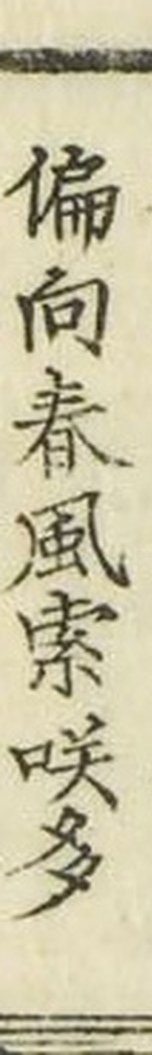偏向春風索咲多
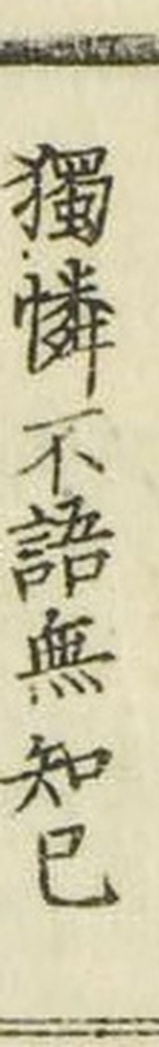獨憐不語無知己
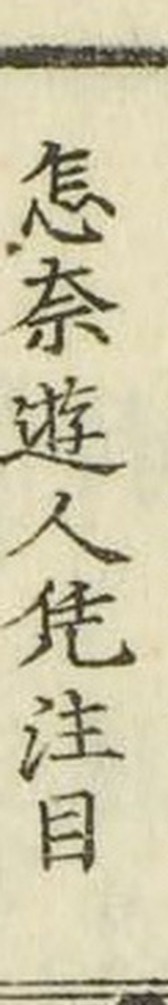怎奈遊人凭注目
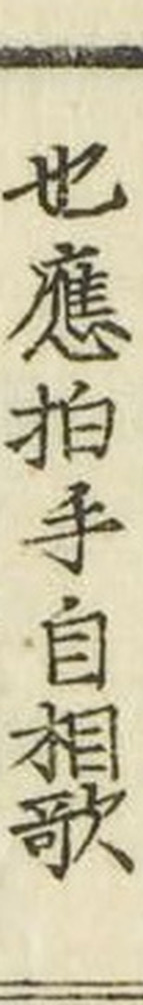也應拍手自相歌
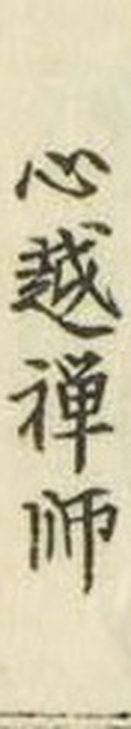心越禅師
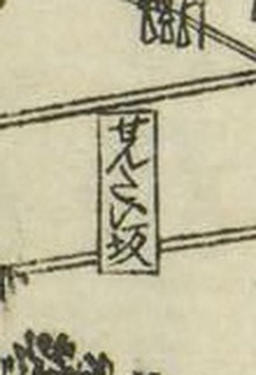せんたい坂

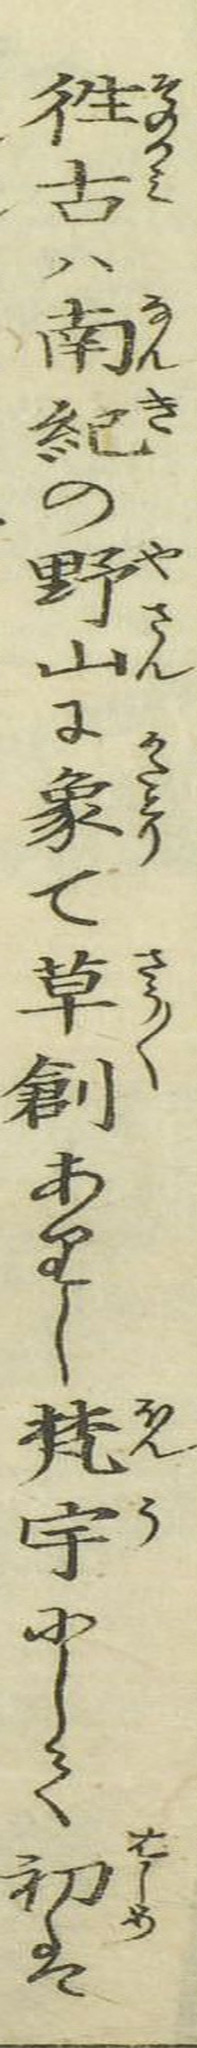往古は南紀の野山に象て草創ありし梵宇にして初は
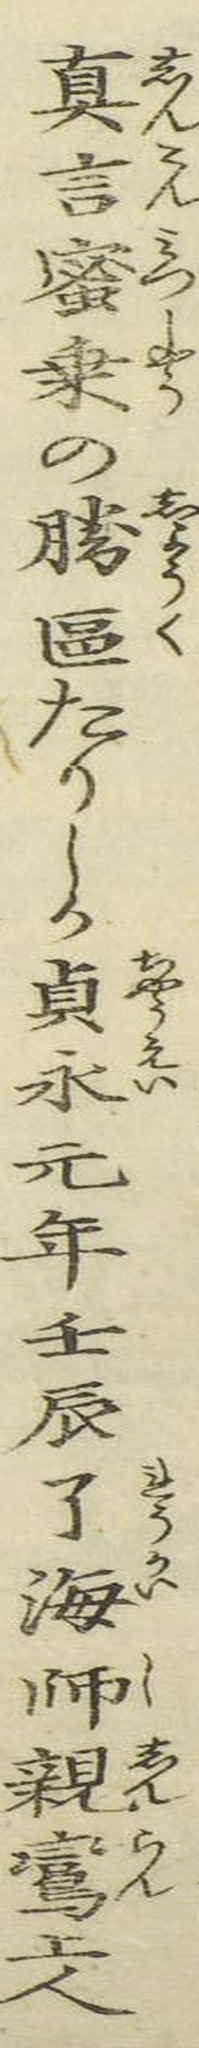真言蜜乗の勝區たりしか貞永元年壬辰了海師親鸞上人
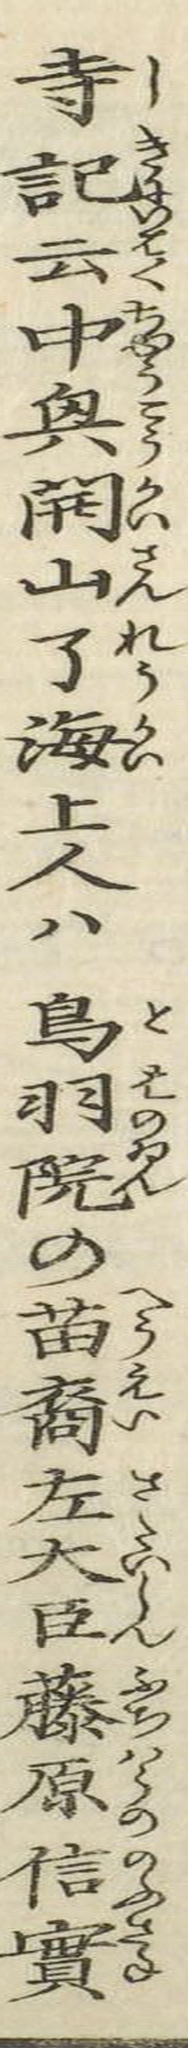寺記云中興開山了海上人は鳥羽院の苗裔左大臣藤原信實
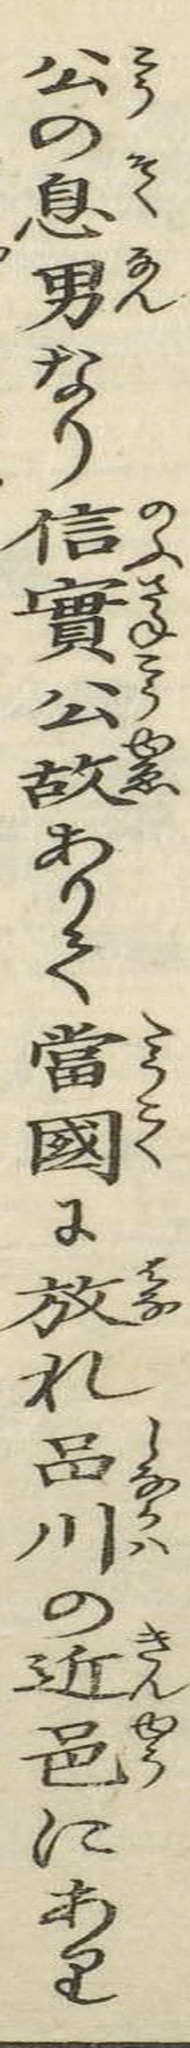公の息男なり信實公故ありて當國に放れ品川の近邑にあり
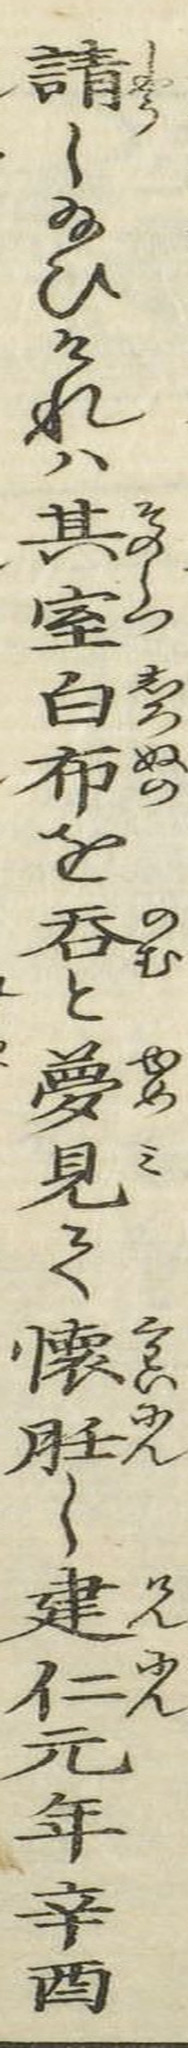請し給ひけれは其室白布を吞と夢見て懐䏕し建仁元年辛酉
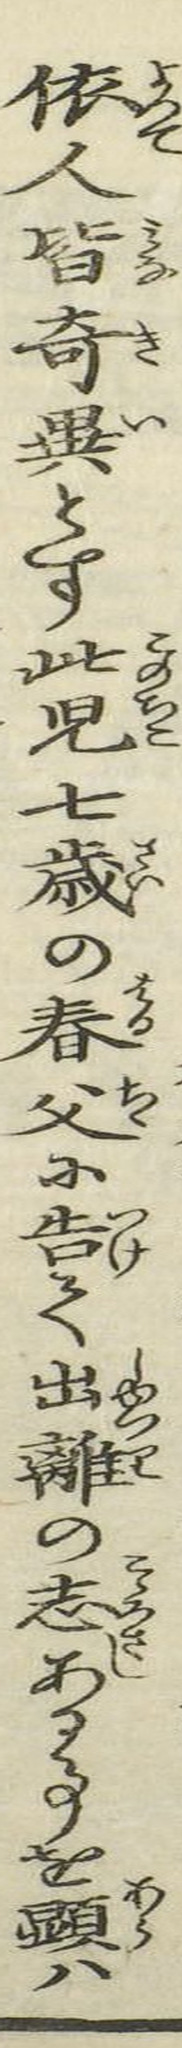依人皆奇異とす此児七歳の春父に告て出離の志ある事を顕は
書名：江戸名所図会 20巻 巻之7
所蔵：東京学芸大学教育コンテンツアーカイブ
